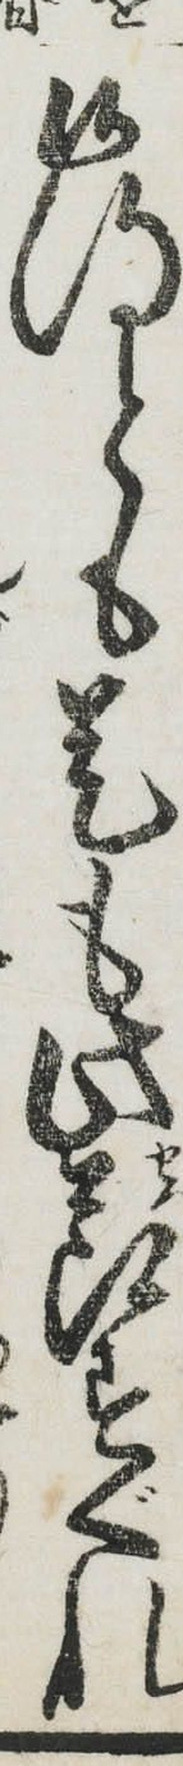候得とも是も此節すぐれ
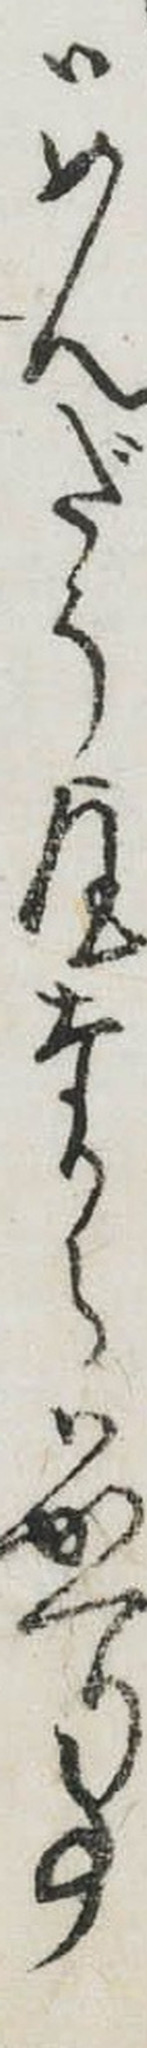御めんだうさまなから御かへり事
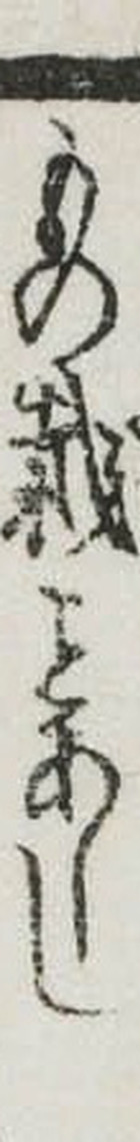もの裁ことあしし
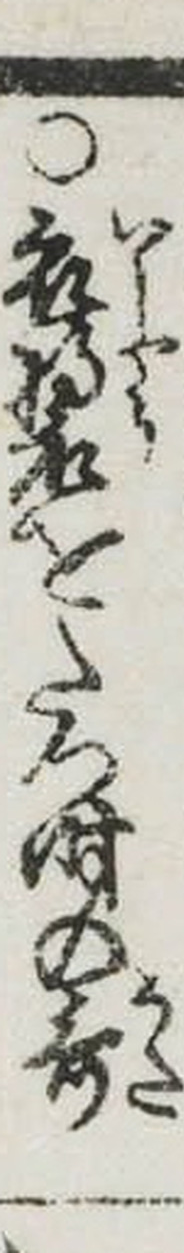○衣装をたつ時の歌
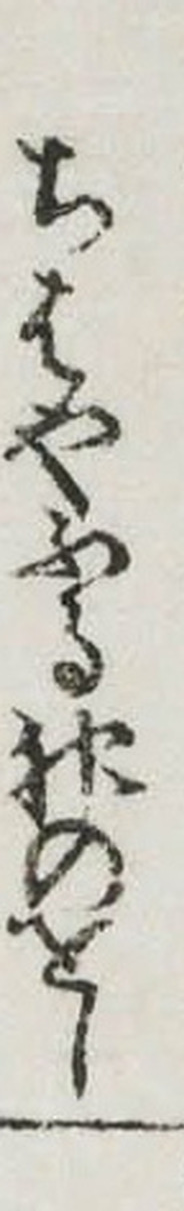ちはやふる神のをし
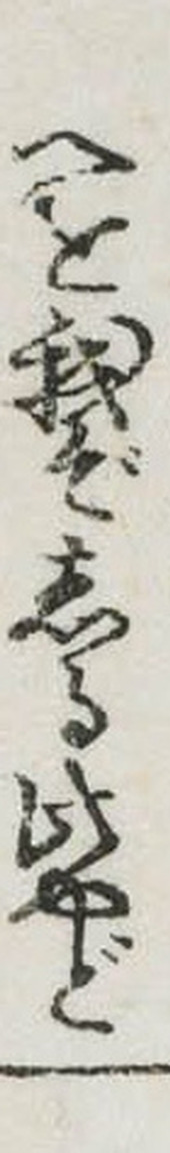へを我ぞしる此やど
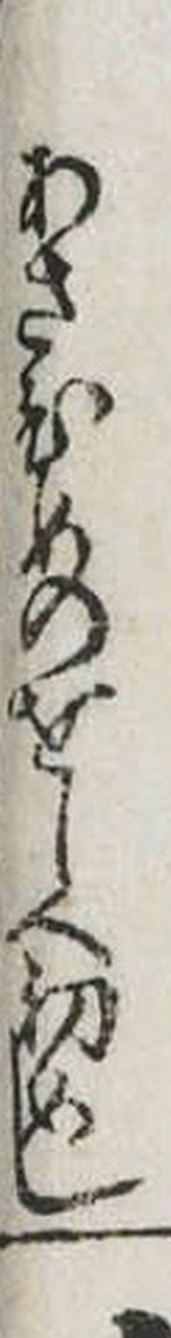あさひめのをしへ初めし
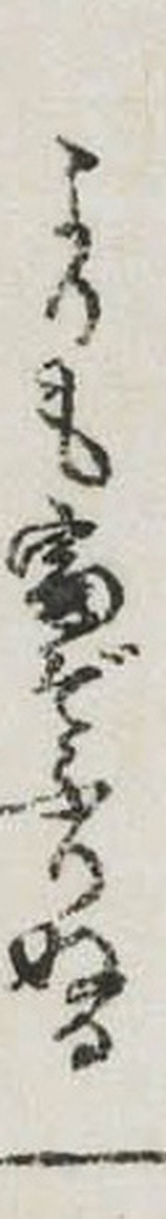よりも富ぞふりぬる
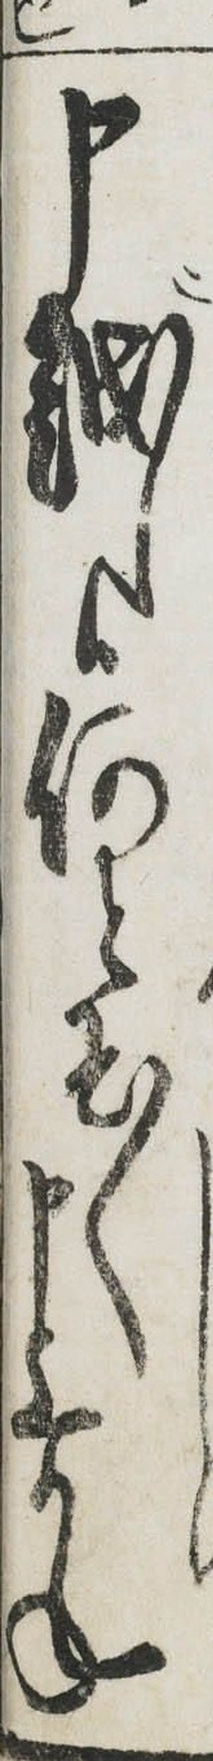申越し候何とそ〳〵申上かね
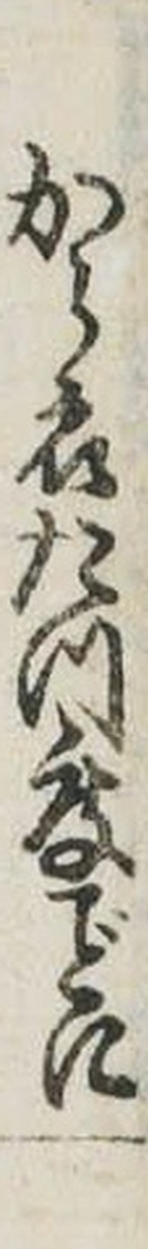から衣たつ度ごとに
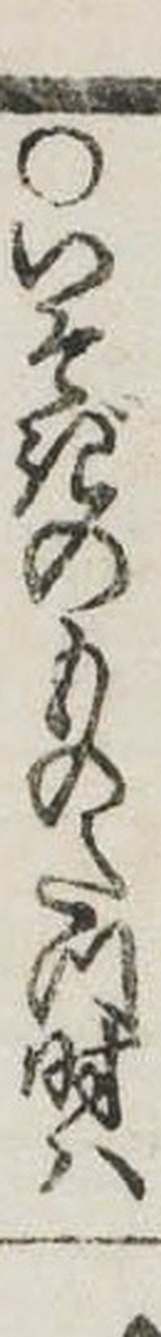○いそぎのものたつ時は
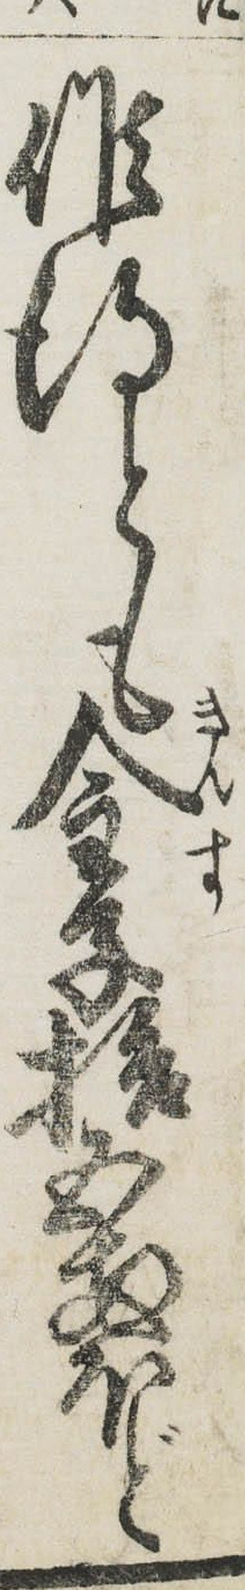候得とも金子拾五両ほど
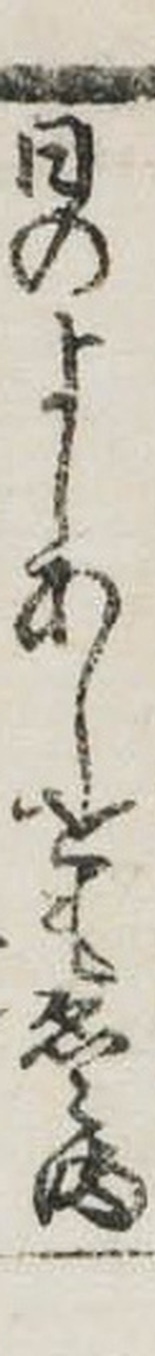日のよしあしをもゑらま
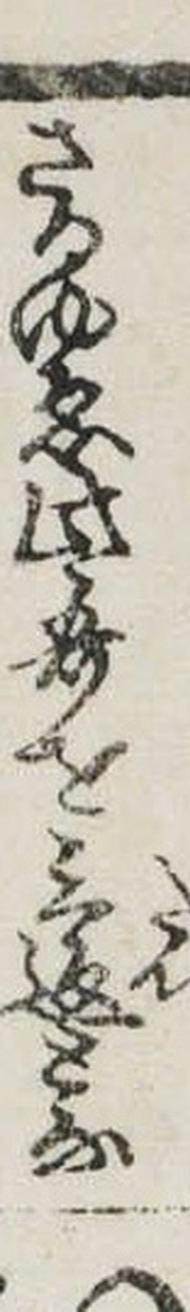さるゆゑ此歌を三返とな
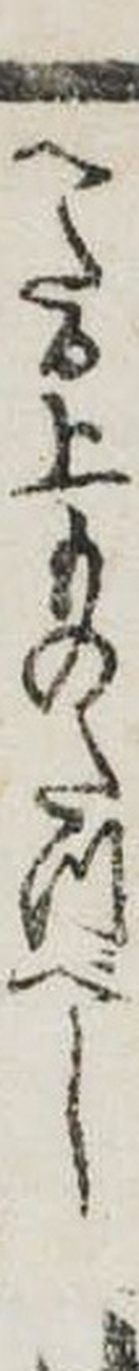へたる上ものたつべし
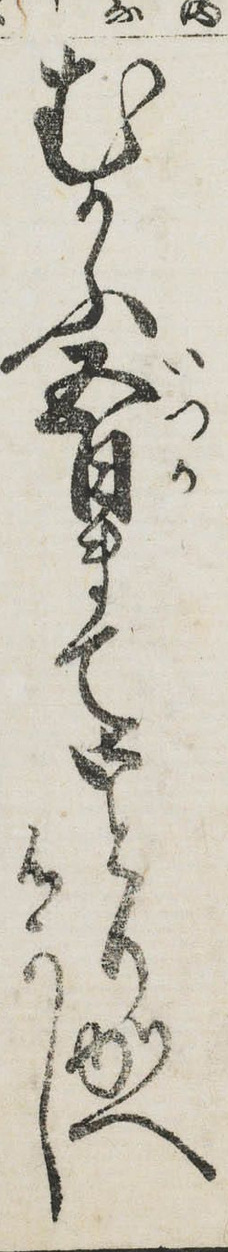むかふ五日まて御とりかへ御かし
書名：頭書萬用婦人手紙之文言
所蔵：東京学芸大学教育コンテンツアーカイブ
